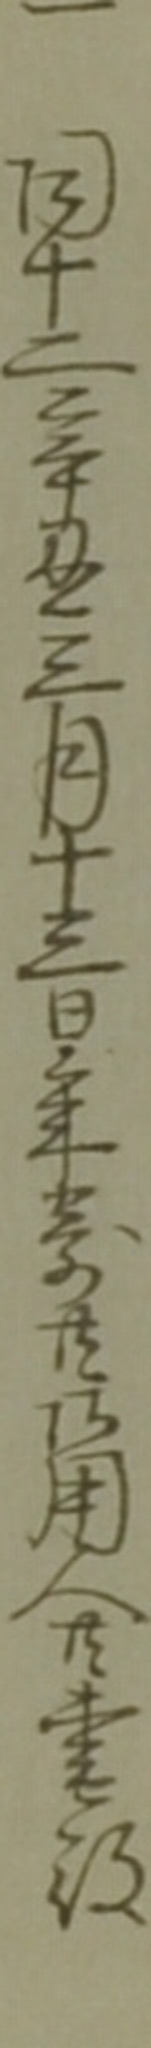一同十二辛丑三月十三日年寄共御用人共書役
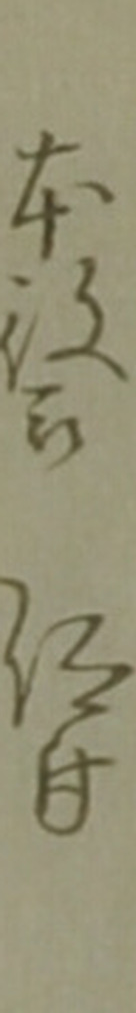本役被仰付
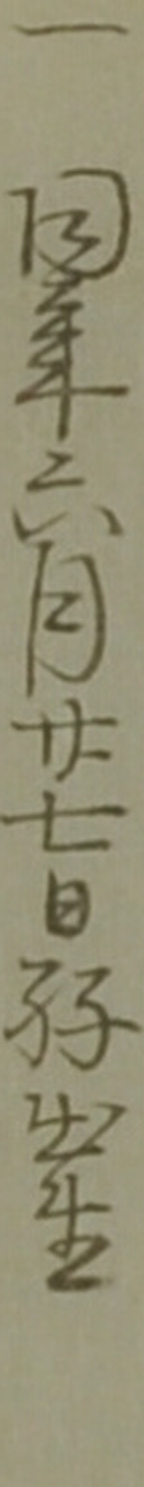一同年六月廿七日孖出生
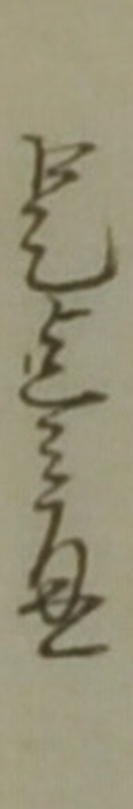是迄之通
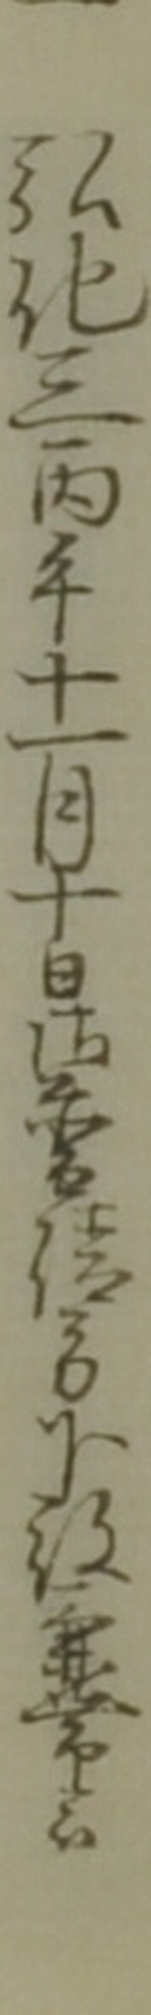一弘化三丙午十一月十日御普請方下役兼帯被
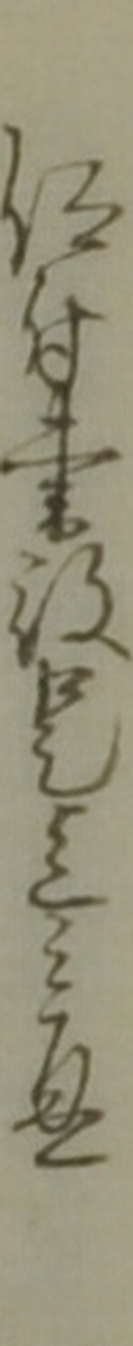仰付書役是迄之通
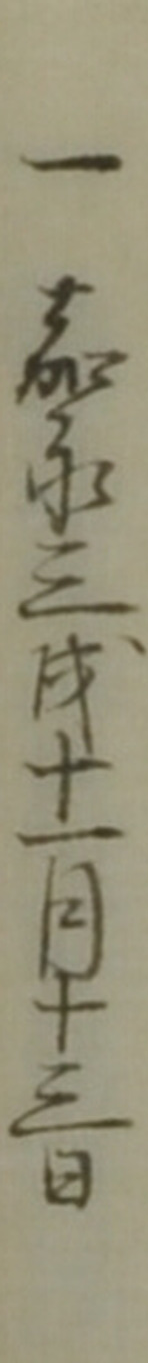一嘉永三戌十一月十三日
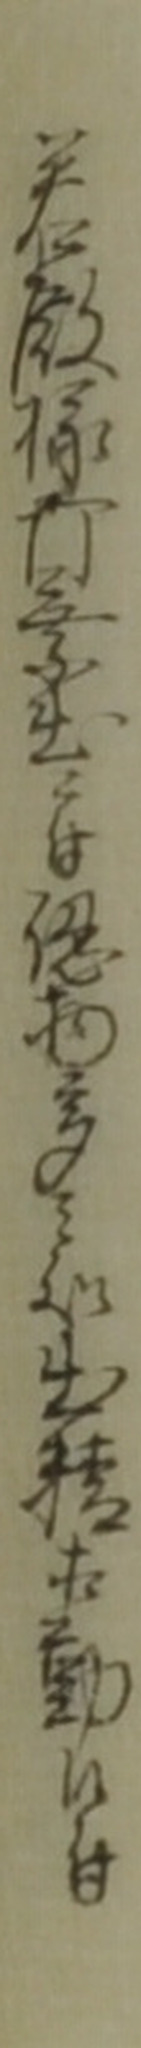若殿様御乗出ニ付認物多之処出精相勤候付
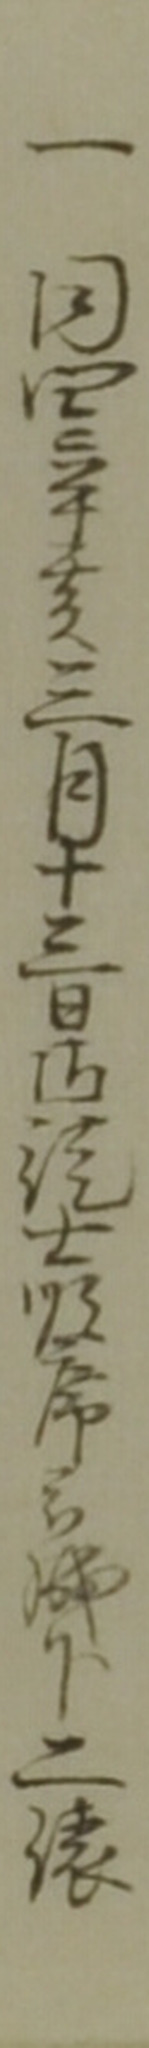一同四辛亥三月十三日御徒士順席被成下二俵
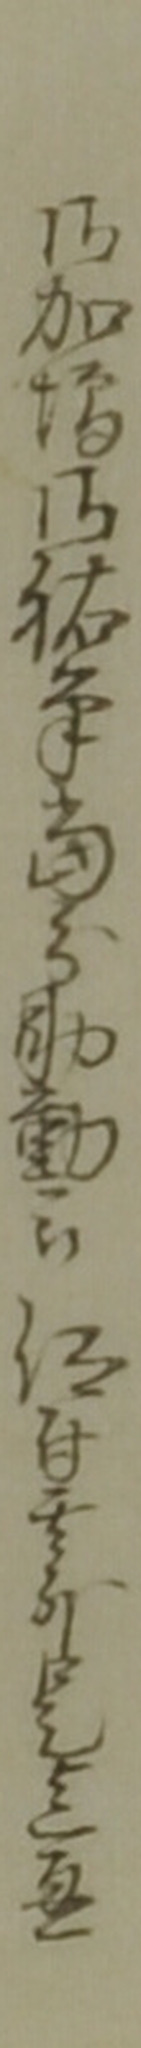御加増御祐筆当分助勤被仰付其外是迄通
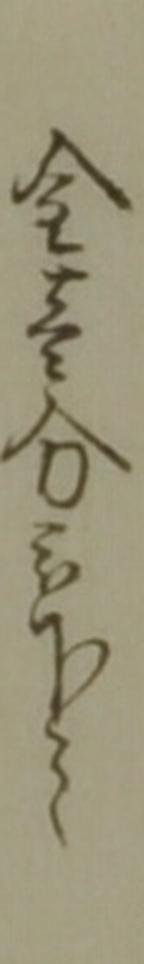金壱分被下之
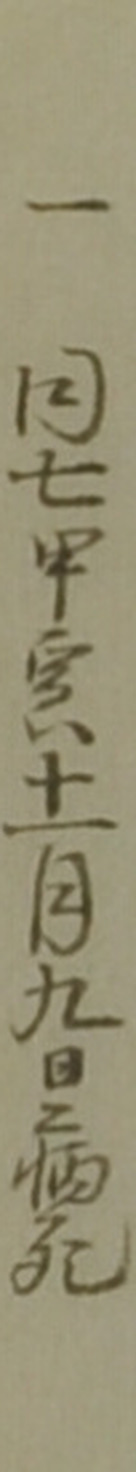一同七甲寅十一月九日病死
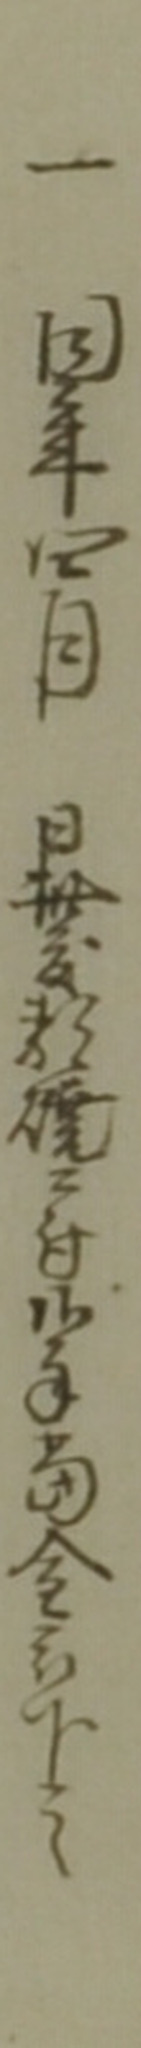一同年四月日此度類焼ニ付御手当金被下之
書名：無足諸士勤仕録（七）
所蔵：伊那市立高遠町図書館・合同会社AMANE
